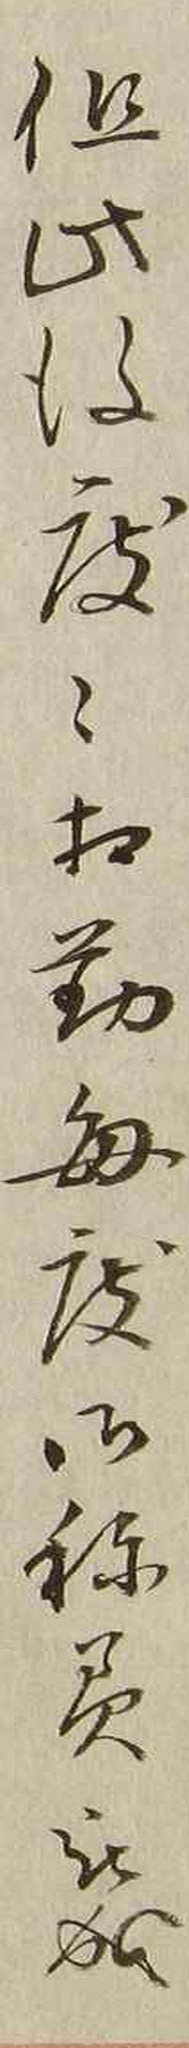但し此後度々相勤め毎度御称美成し
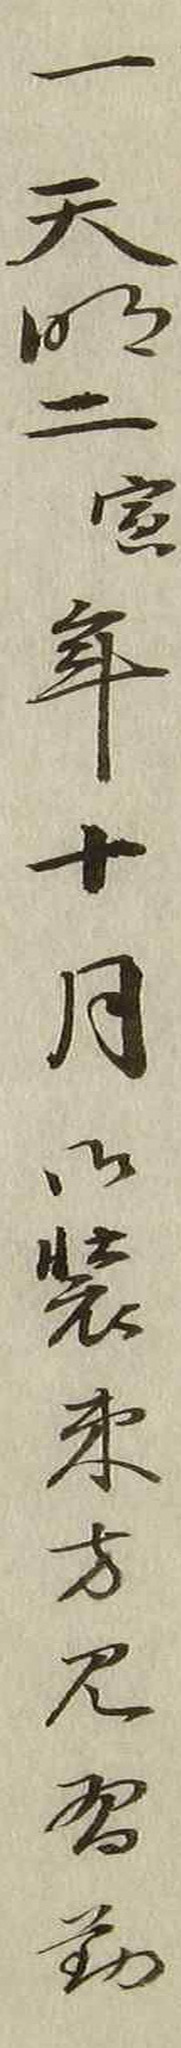一天明二寅年十月御装束方見習勤め
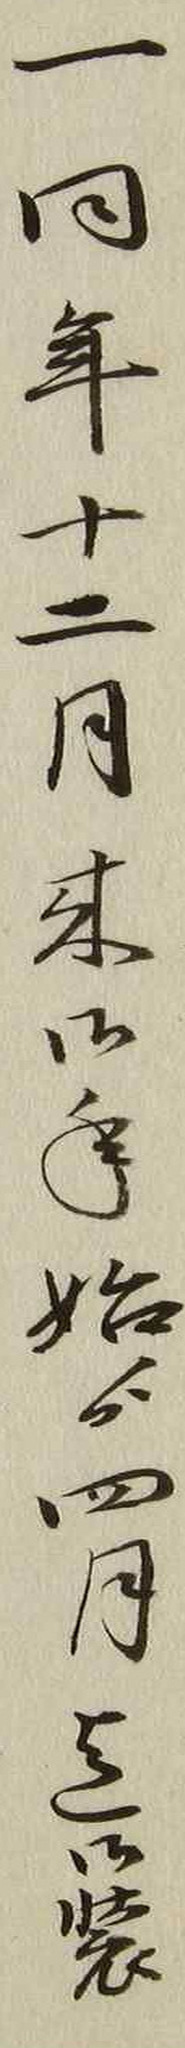一同年十二月来御手始めより四月迄御装
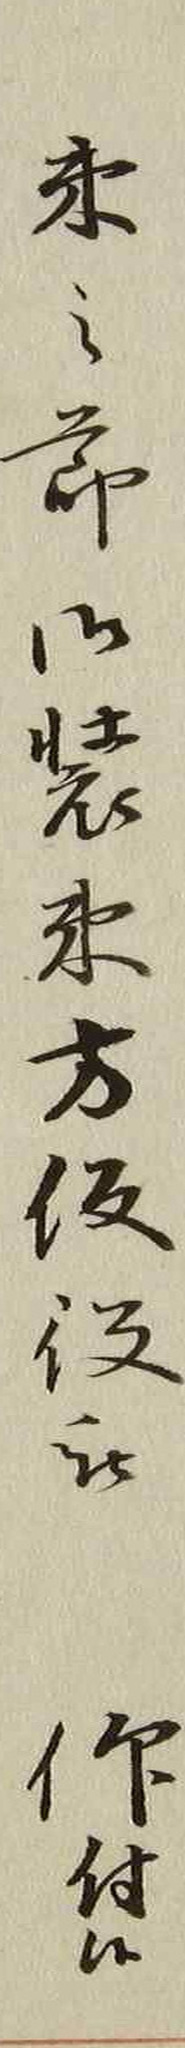束之節御装束方仮役仰せ付けられ候
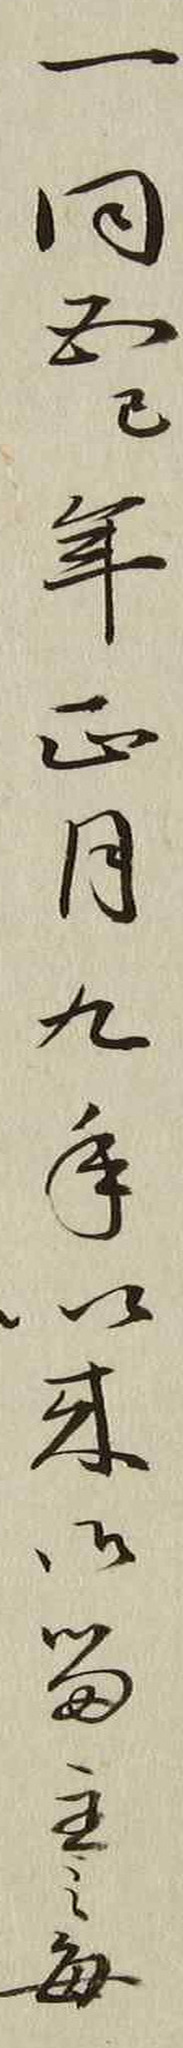一同五巳年正月九年以来御留守之毎
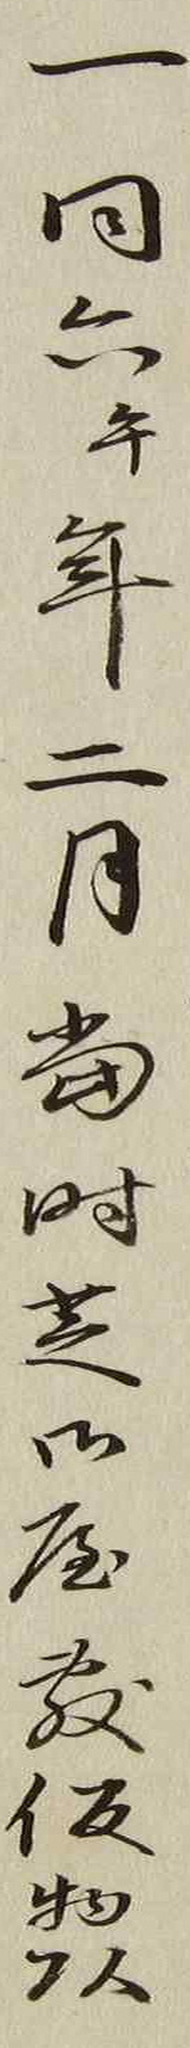一同六午年二月当時芝御屋敷仮物頭
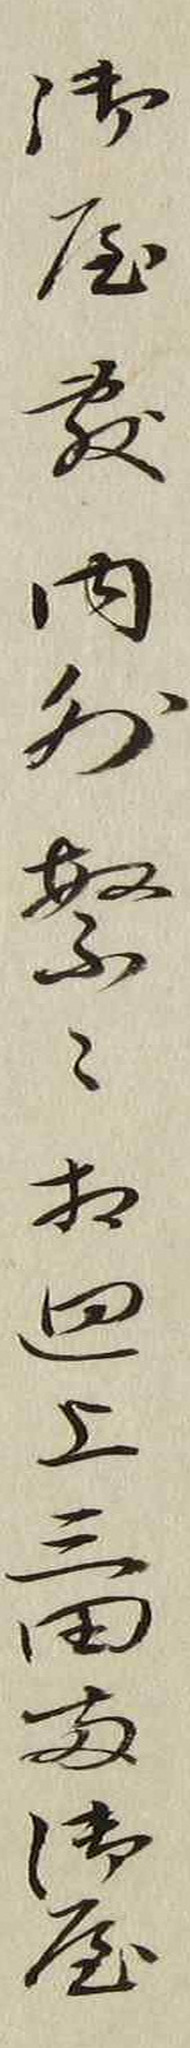御屋敷内外繁々相廻り上三田両御屋
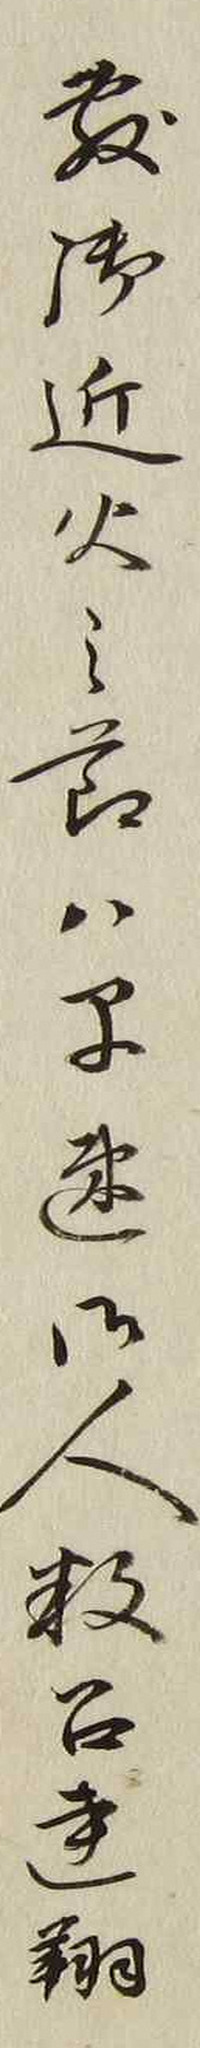敷御近火之節ハ早速御人数召連れ翔
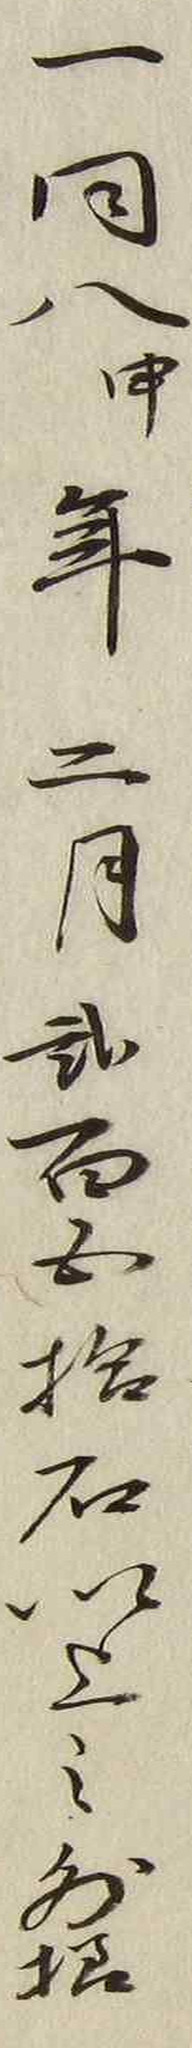一同八申年二弐百五拾石以上之外様

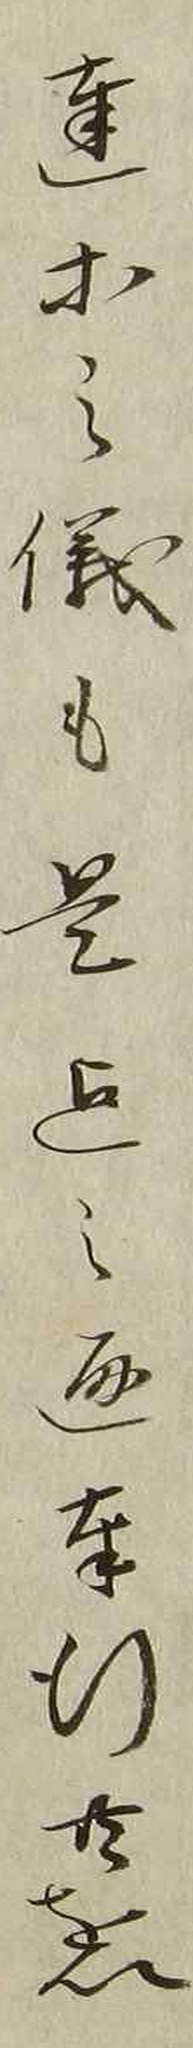達等之儀も是迄之通り奉行共を以て
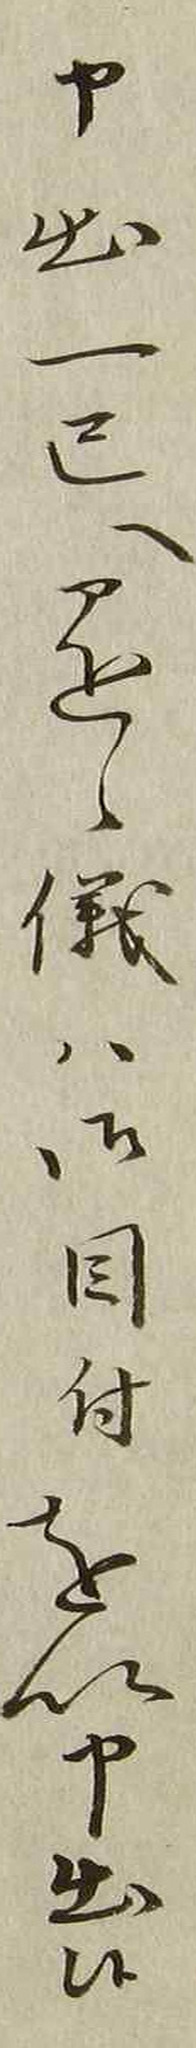申出で一己へ懸り候儀ハ御目付を以て申出候
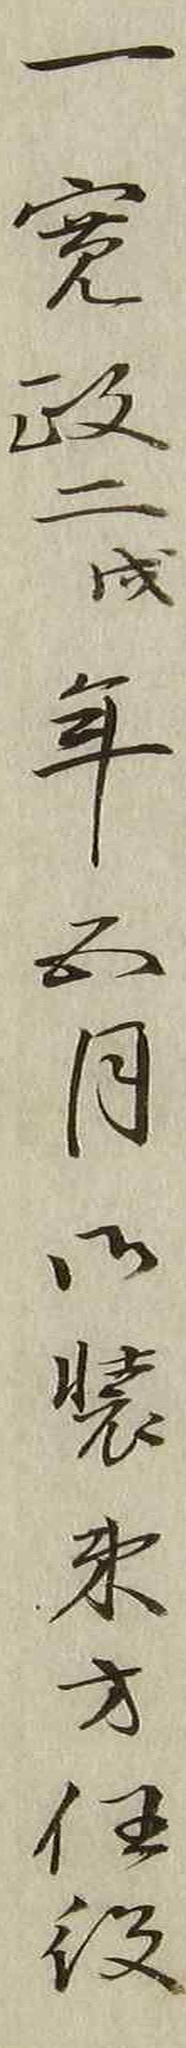一寛政二戌年五月御装束方任せ役
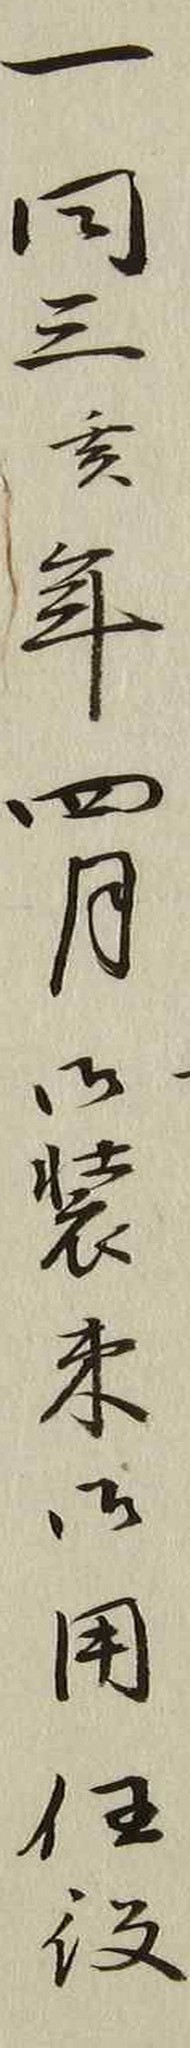一同三亥四月御装束御用任せ役
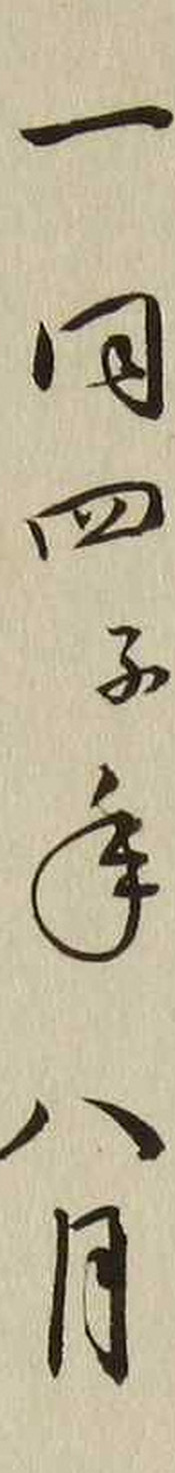一同四子年八月
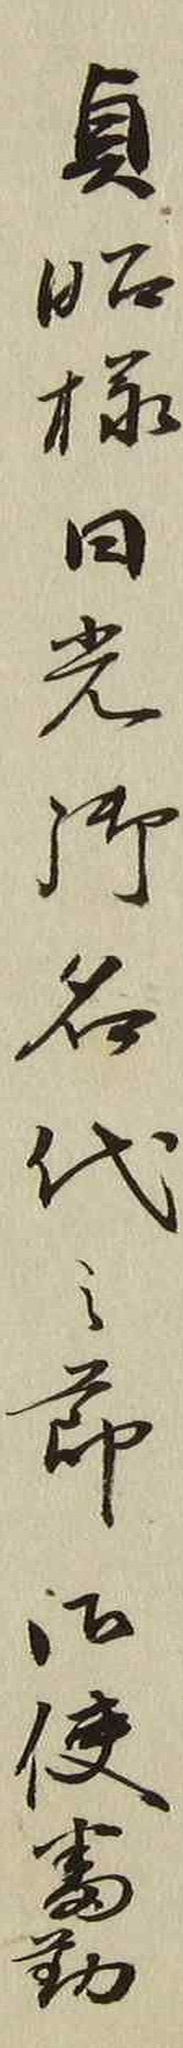貞昭様日光御名代之節御使番勤め
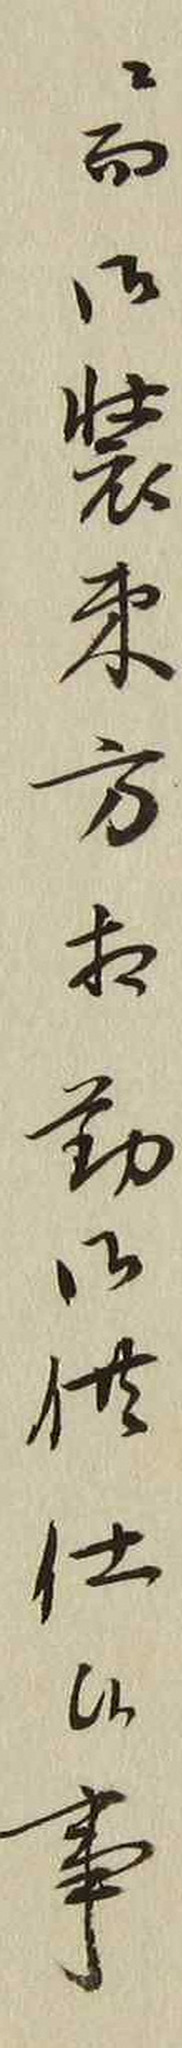ニて御装束方相勤め御供仕り候事
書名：諸士系譜　巻之19　い之部19
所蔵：会津若松市立会津図書館
